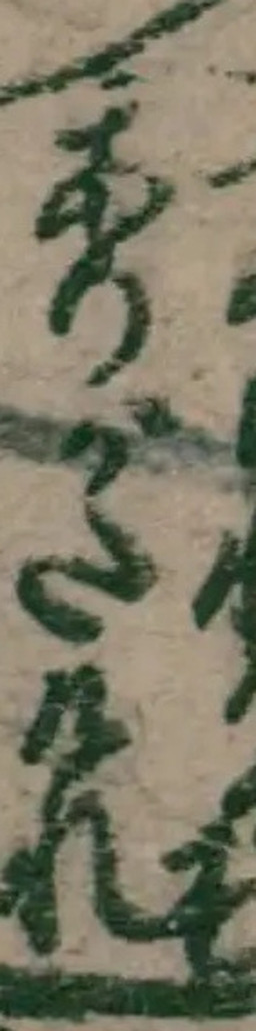ありがたけれ
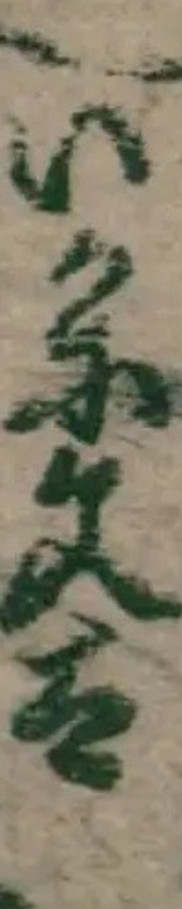いかに文太
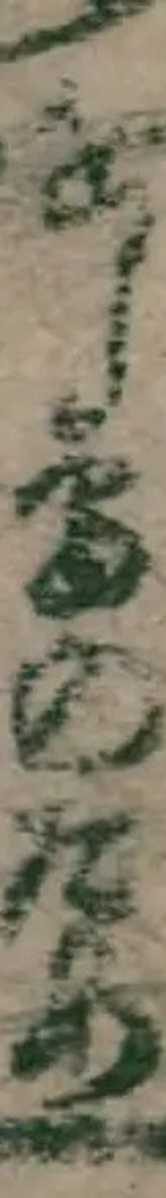をし鳥のため
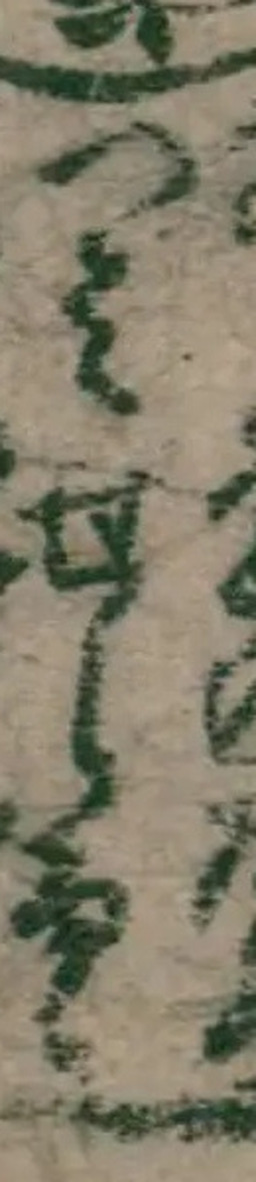つみせらるゝ

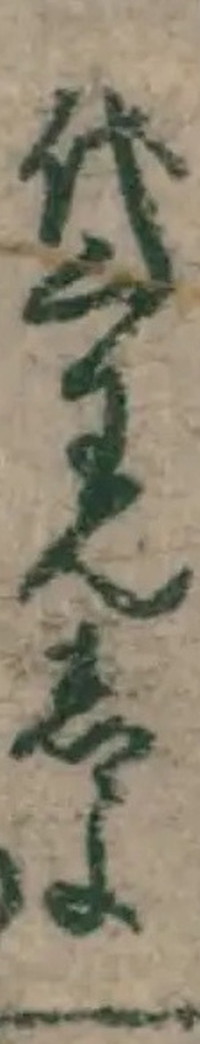代くわんしよ
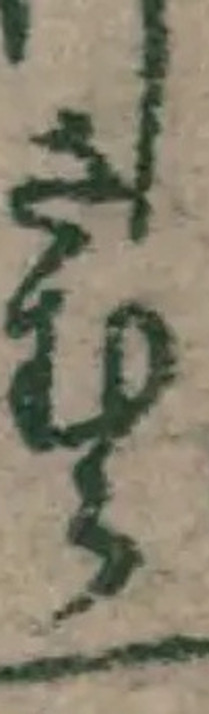さむら
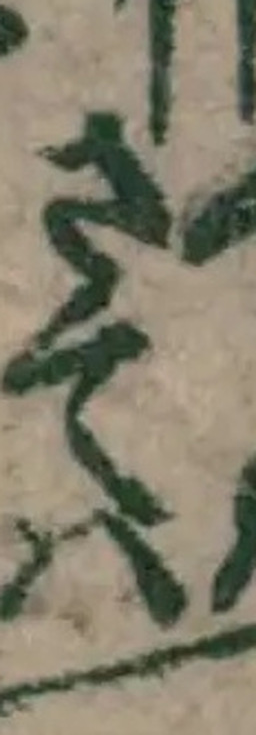さては
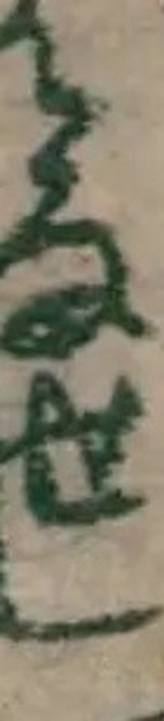はなせし
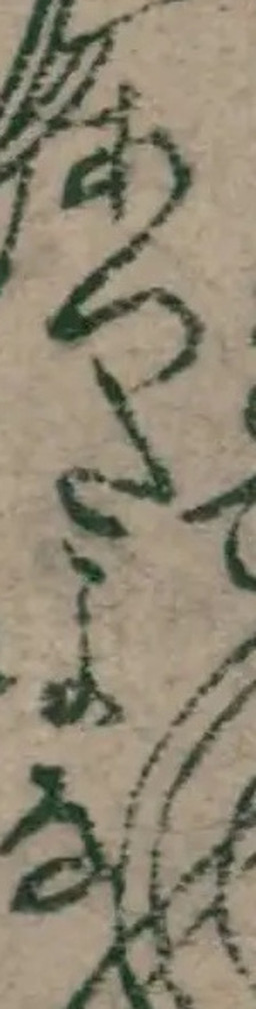あつたよな
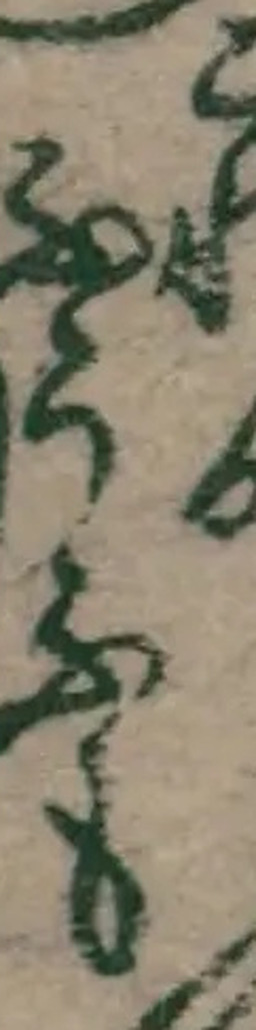ふうふも
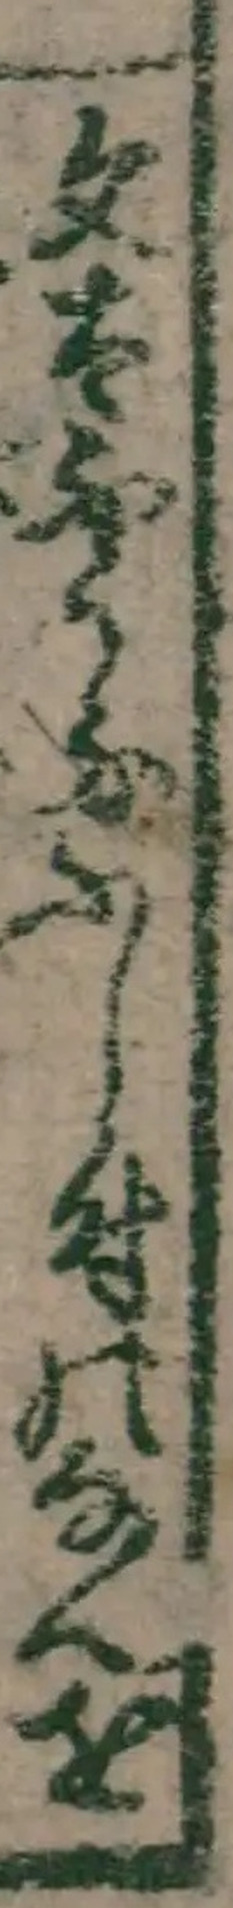文太ふうふふし付のなんを
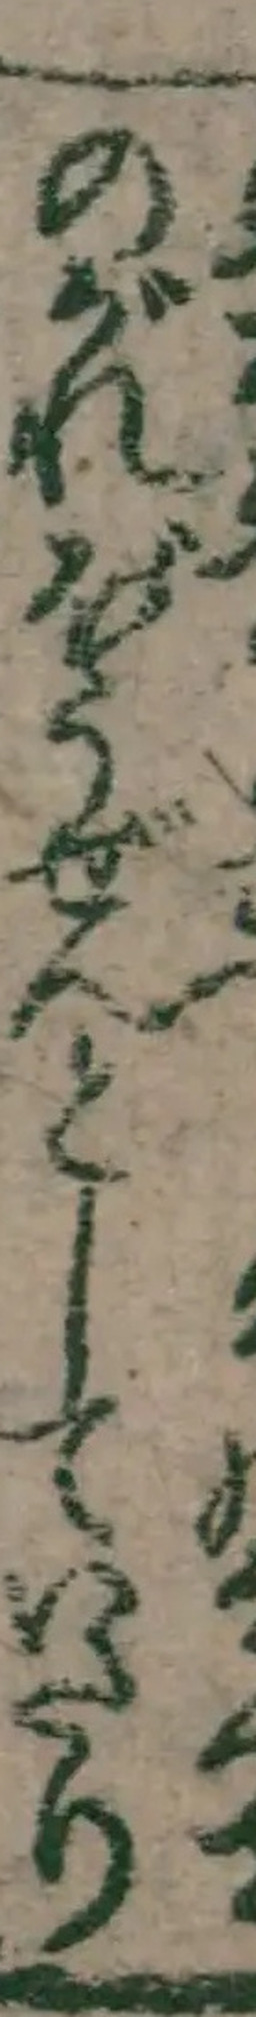のがれぼうぜんとしていたり
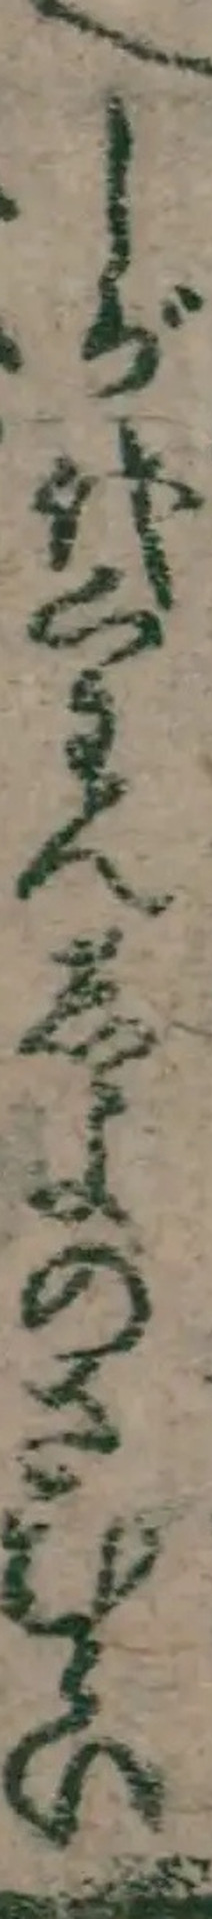しが代くわんしよのさむらい
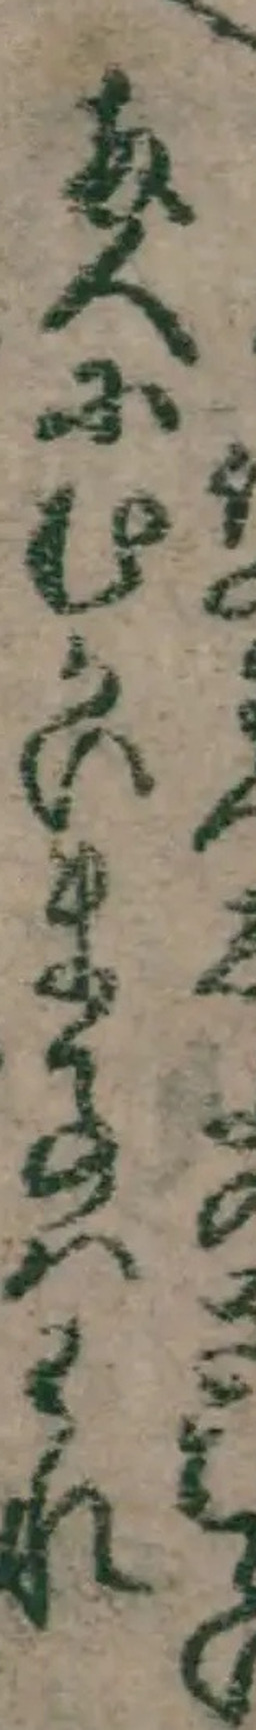両人にむかいま事はわれ
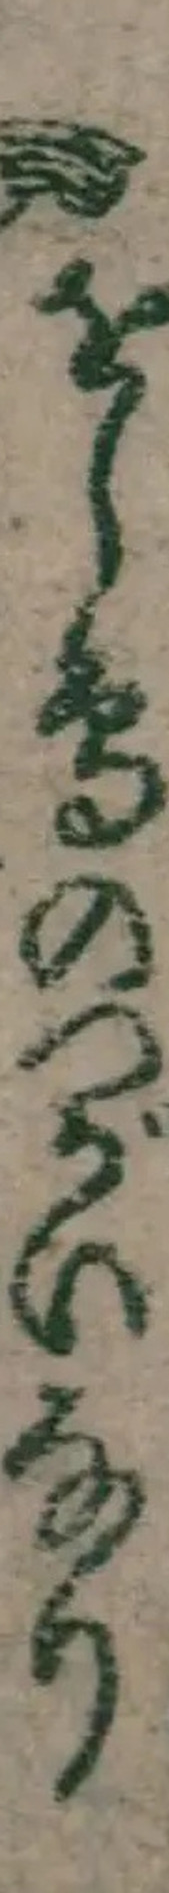をし鳥のつがいなり
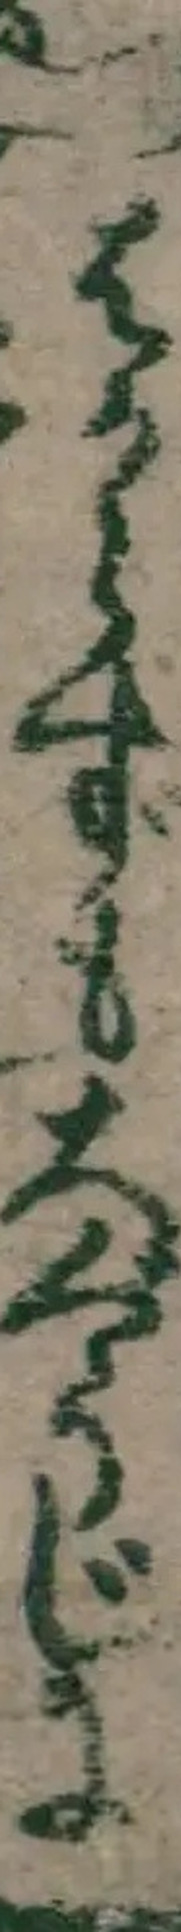はからずも代ぐうじに
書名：塩売文太物語 2巻
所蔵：国立国会図書館 National Diet Library, JAPAN
